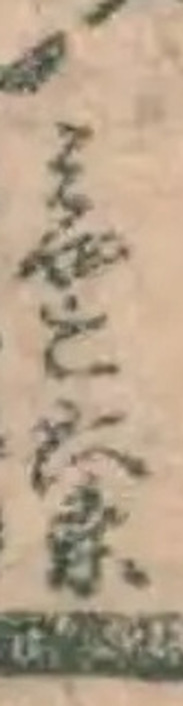みやこ六条
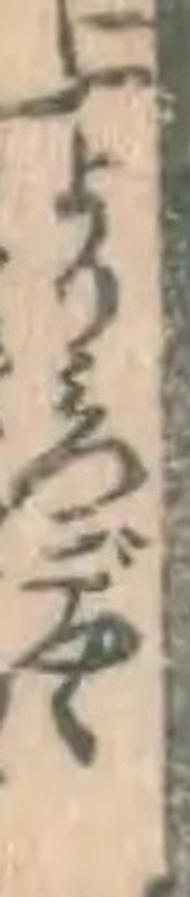よりみつごやく
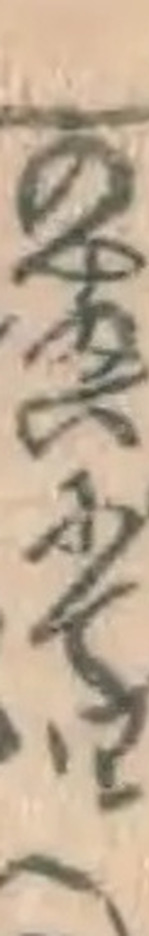のやまいにて四
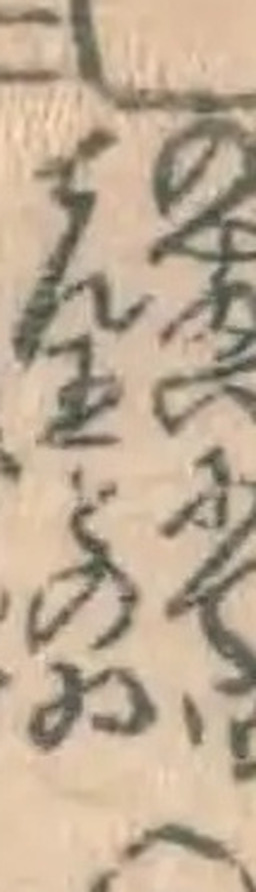てん王とのゐ
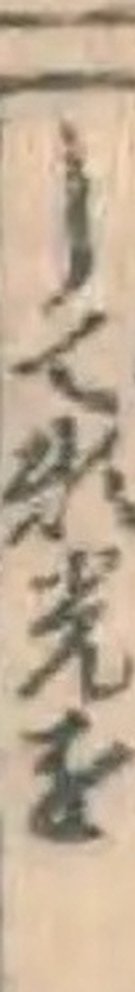して頼光を
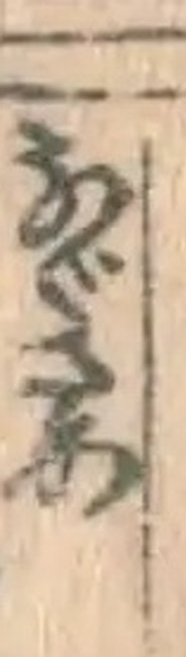なぐさめ
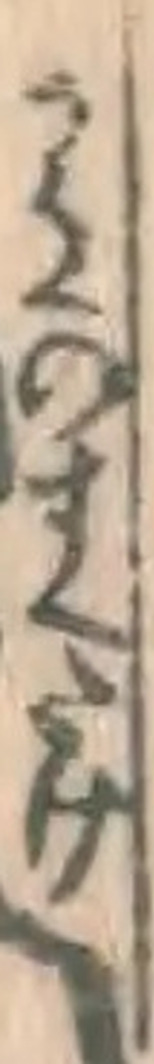うらへのすへたけ
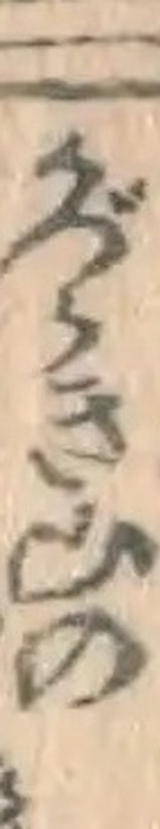かづらき山の
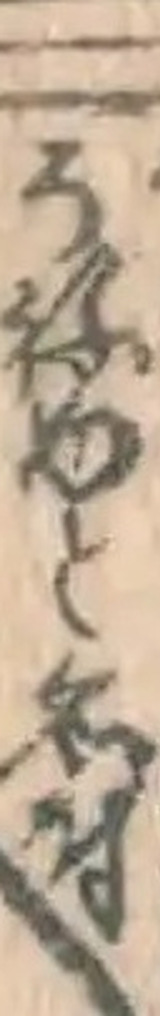うねめと名付
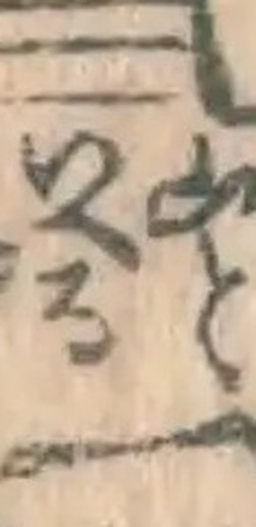いへる
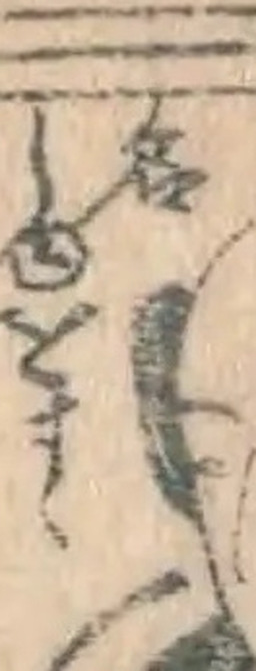しゆをすゝ
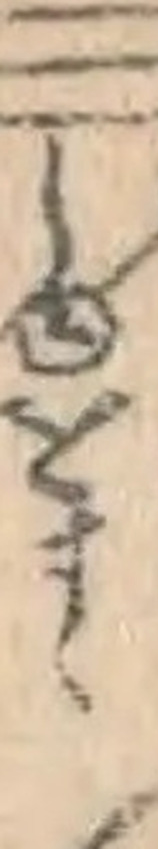しゆをすゝ
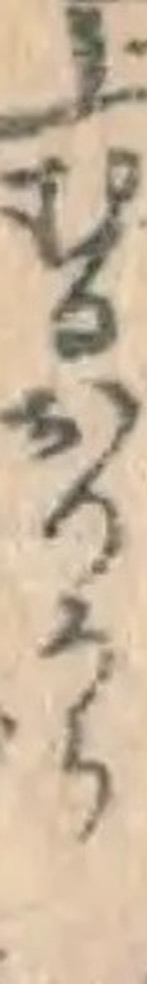むるおりから
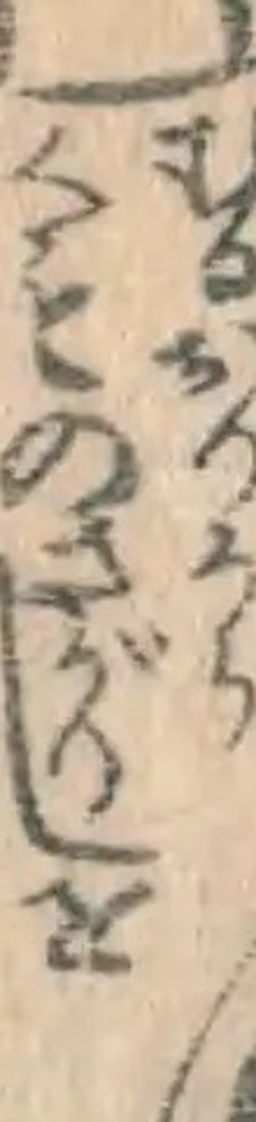くものさがりしを
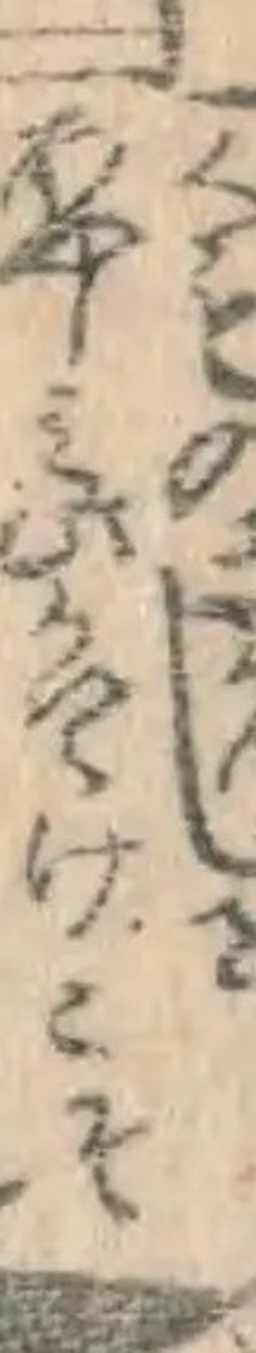あやしみ此かはらけこそ
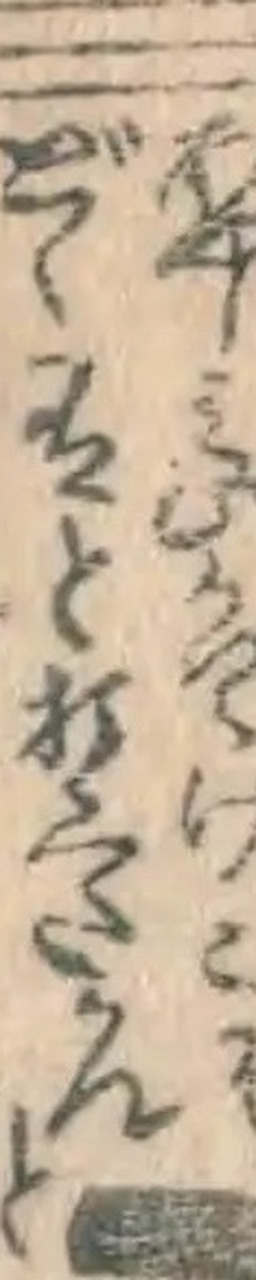どく有と打くたかんと
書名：四天王宿直着綿
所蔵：国立国会図書館 National Diet Library, JAPAN
